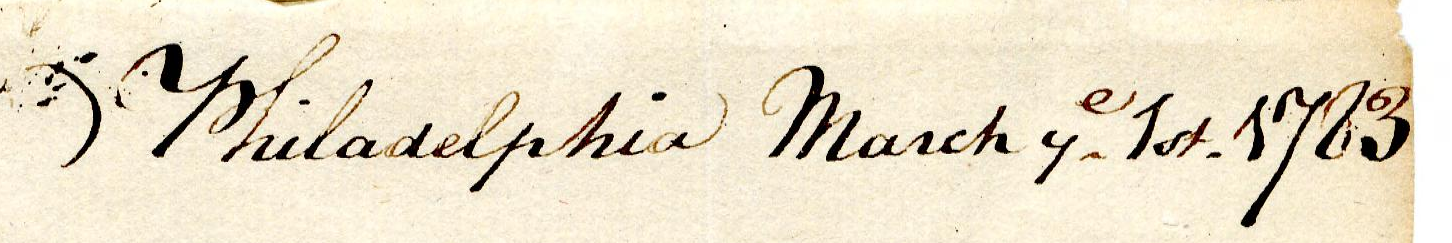Philadelphia March y^e. 1st. 1783.
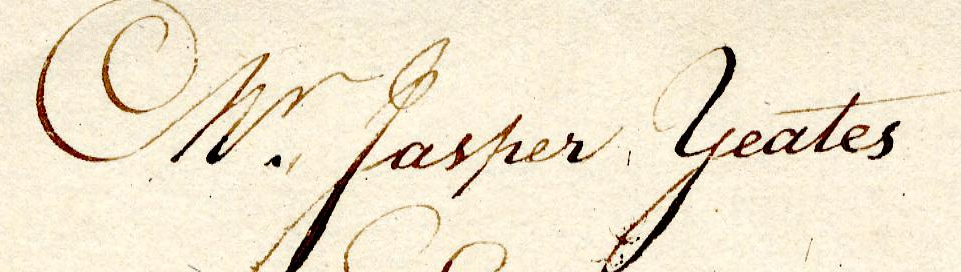M^. Jasper Yeates
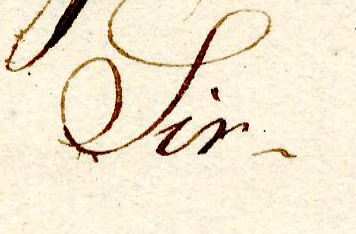Sir
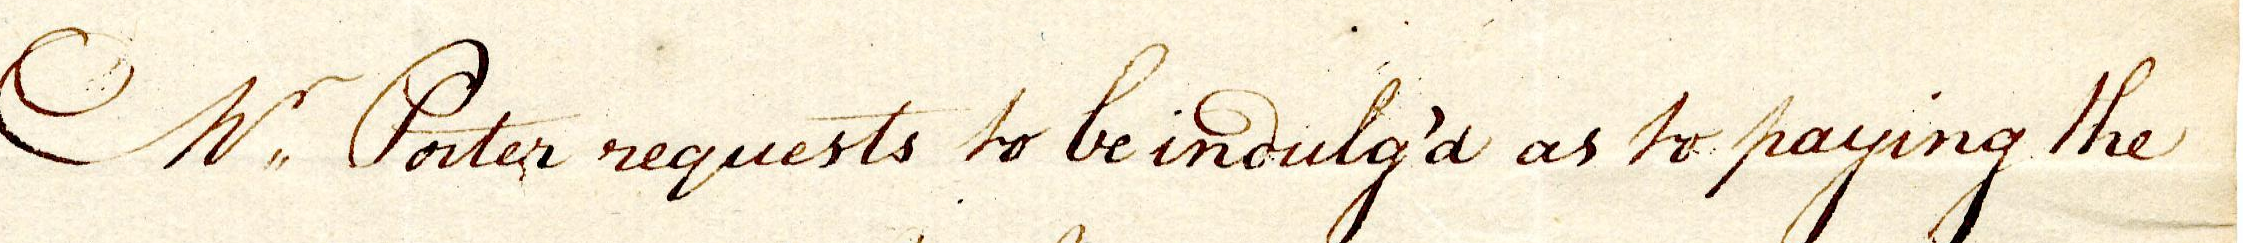M^r. Porter requests to be indulg'd as to paying the
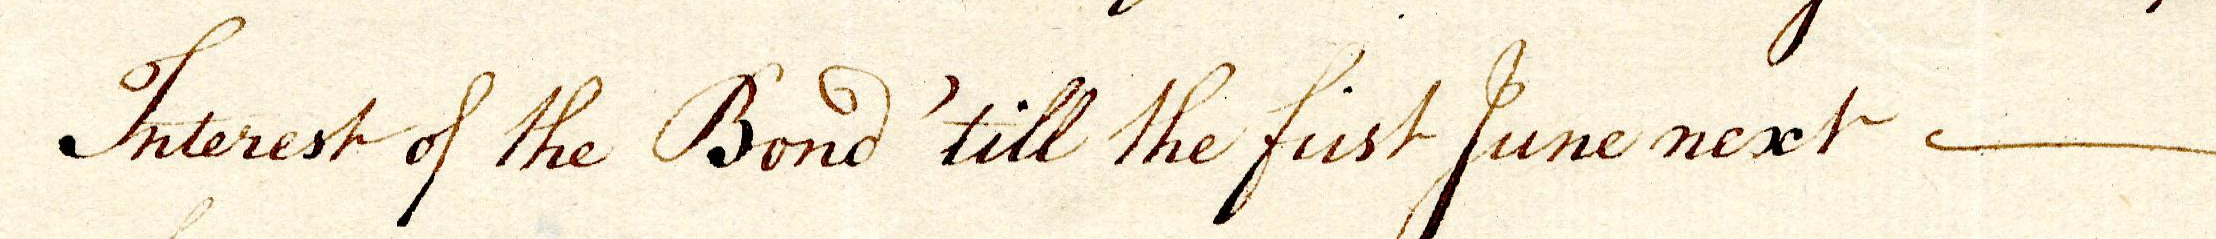Interest of the Bond till the first June next.
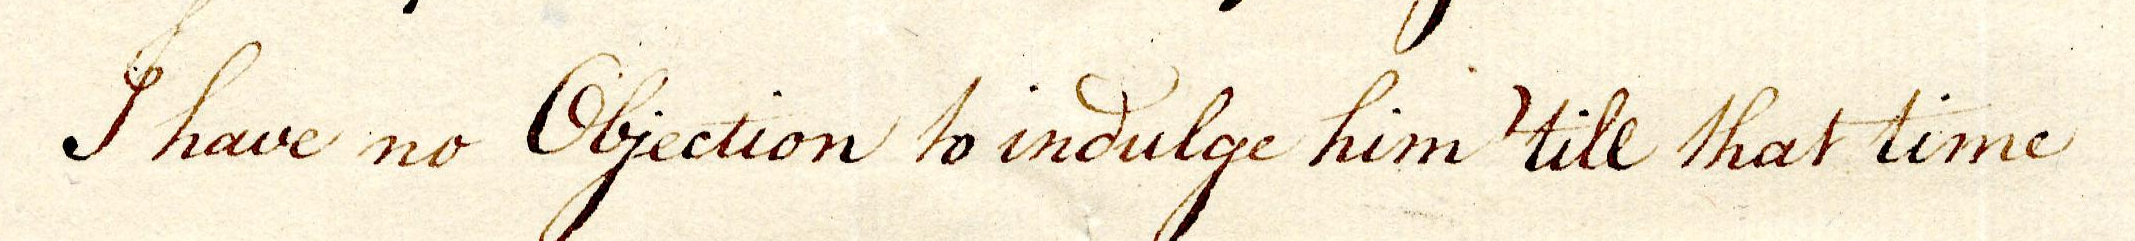I have no Objection to indulge him 'till that time
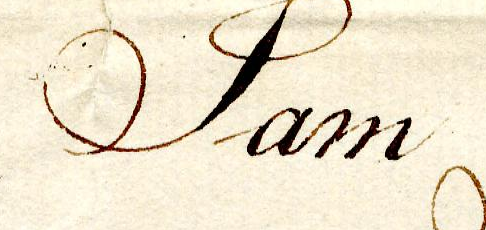I am
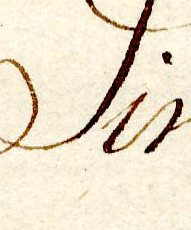Sir
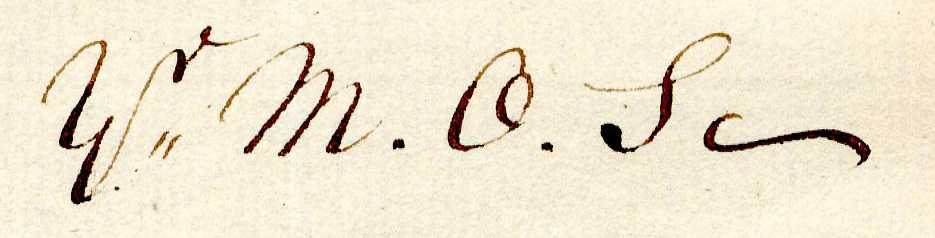Y^r M. O. S.
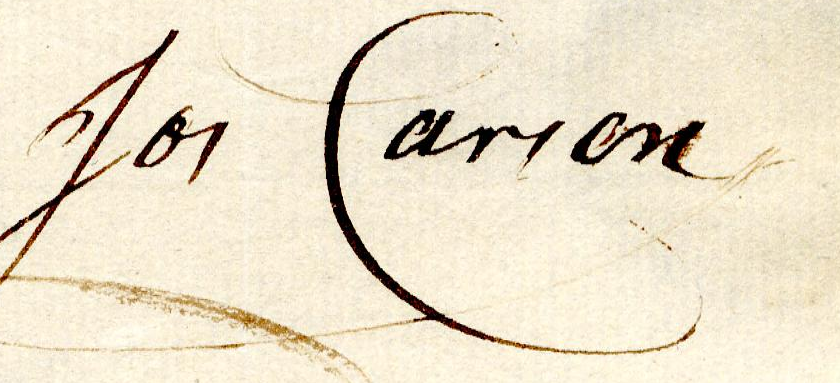Jos Carson
